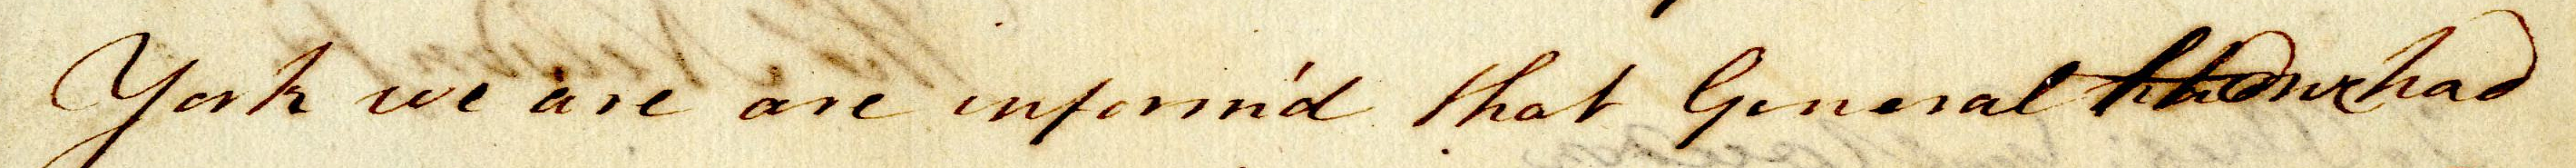York we are are inform'd that General Howe had
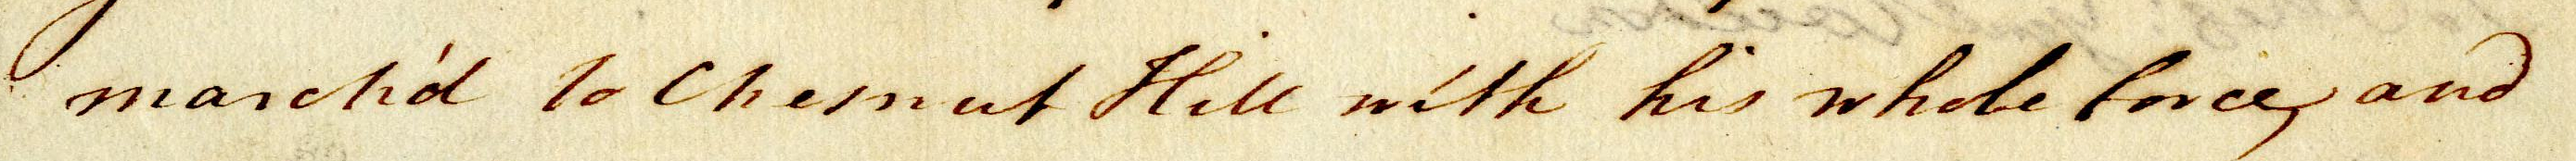march'd to Chestnut Hill with his whole force, and
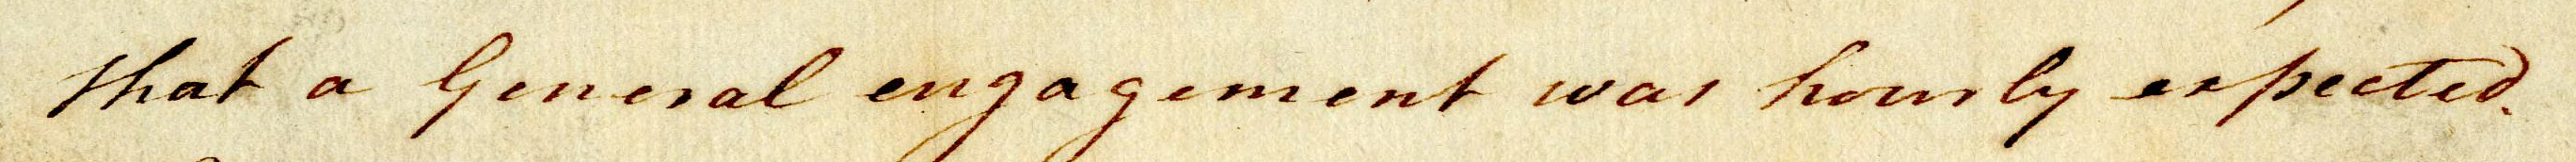that a General engagement was hourly expected.
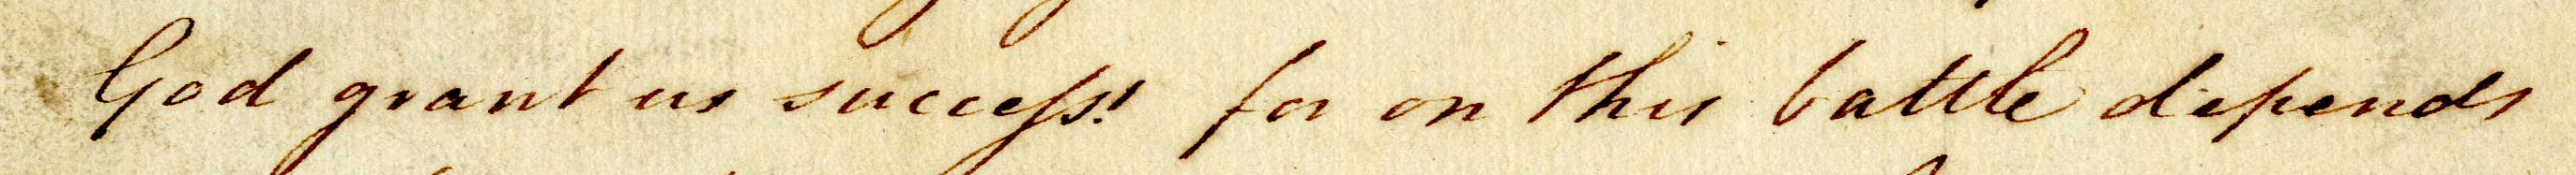God grant us success! for on this battle depends
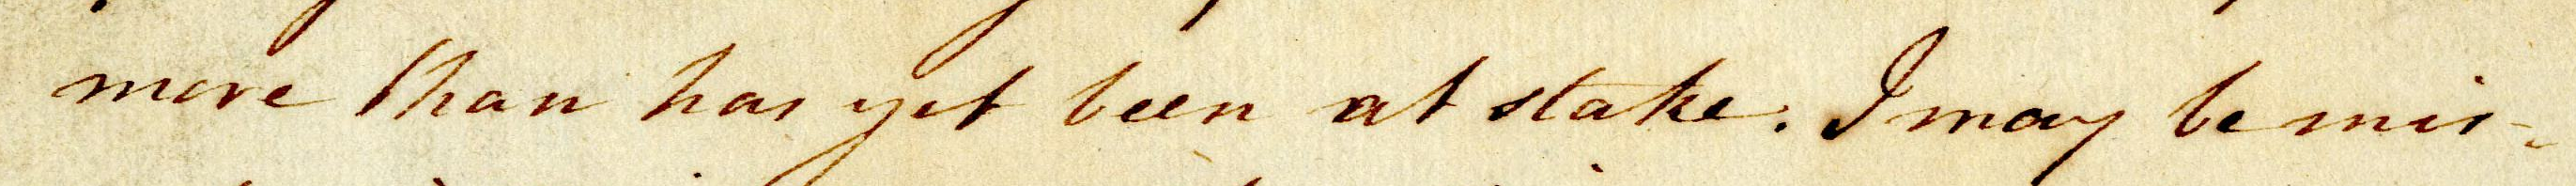more than has yet been at stake. I may be mis-
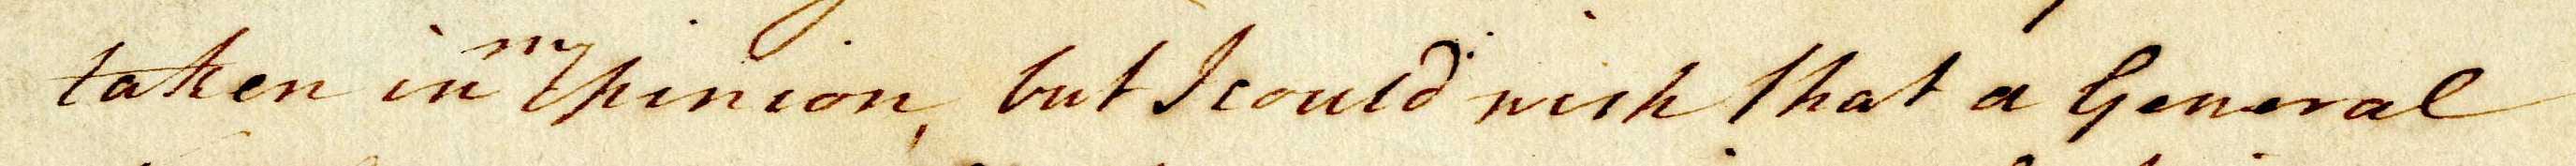taken in ^my opinion, but I could wish that a General
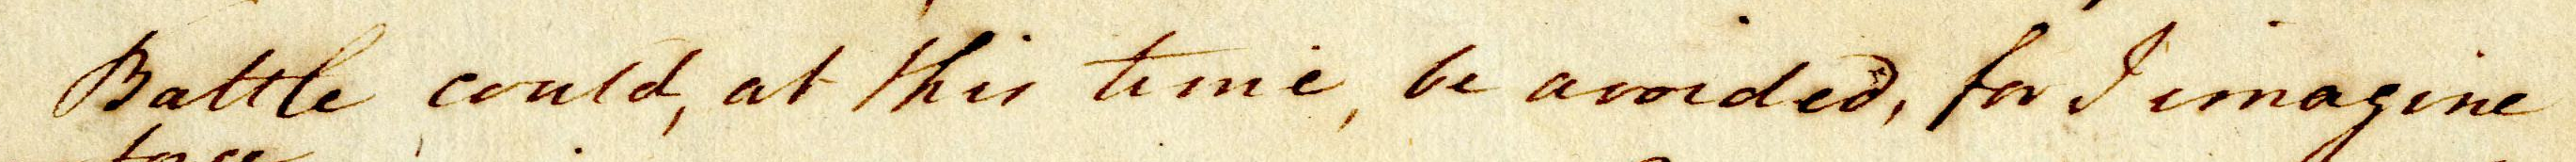Battle could, at this time, be avoided, for I imagine
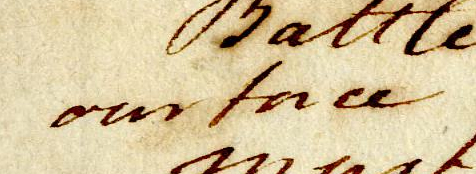our force
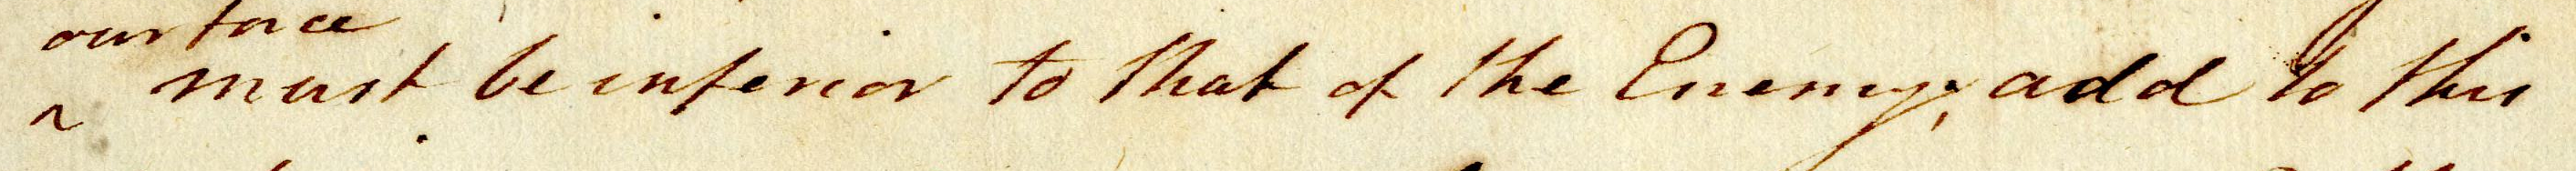^ must be inferior to that of the Enemy, add to this
